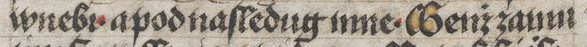wnebi a pod naſledug mne.Genż zamu¬
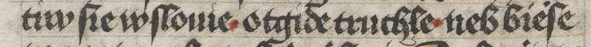tiw ſie w ſlouie.otgide trutchle.neb bíeẛe¬
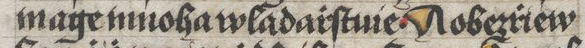mage mnoha wladaṙſtuíe.A obezṙíew
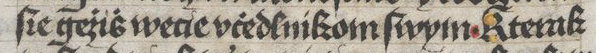ſie geżíṡ vecie vċedlnikom ſwym.Kterak
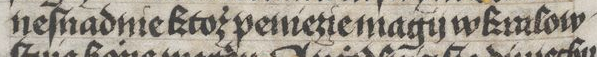neſnadnie ktoż penezíe magij w kralow¬
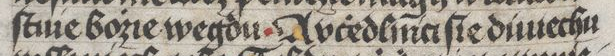ſtuíe bożíe wegdu. A vċedlnici ſie diuiechu
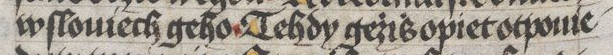w ſlouíech geho.Tehdy geżiṡ opiet otpouie¬
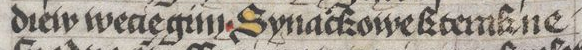diew weċie gim.Synaċkowe kterak ne¬
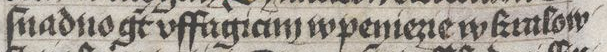ſnadno ḡt vffagícím w peniezie w kralow¬
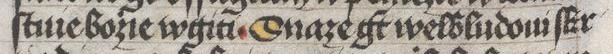ſtuie bożíe wgíti.Snaze ḡt welbludoui ſkr¬
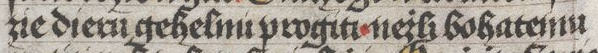zie dieru gehelnu progiti.neżli bohatemu
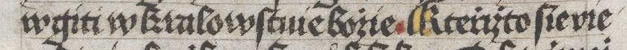wgiti w kralowſtuie bożíe.Kteṙiżto ſie víe¬
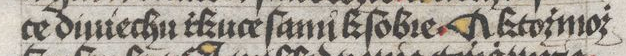ce diuíechu ṙkuce ſami k ſobie. A ktož mož
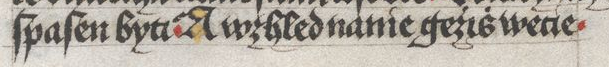ſpaſen byti? A wzhled naníe geżiṡ wecie.
